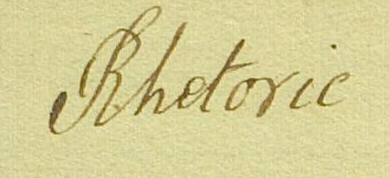Rhetoric
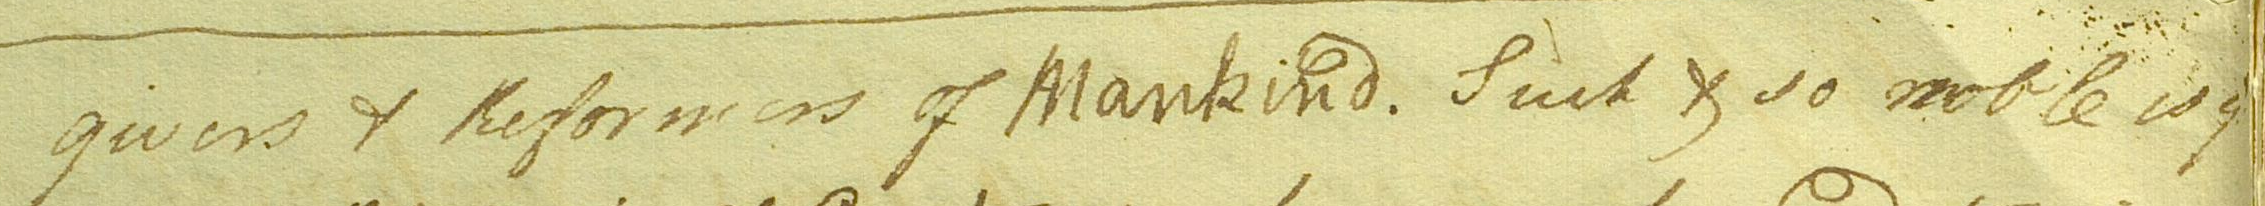givers & Reformers of Mankind. Such & so noble is y^e
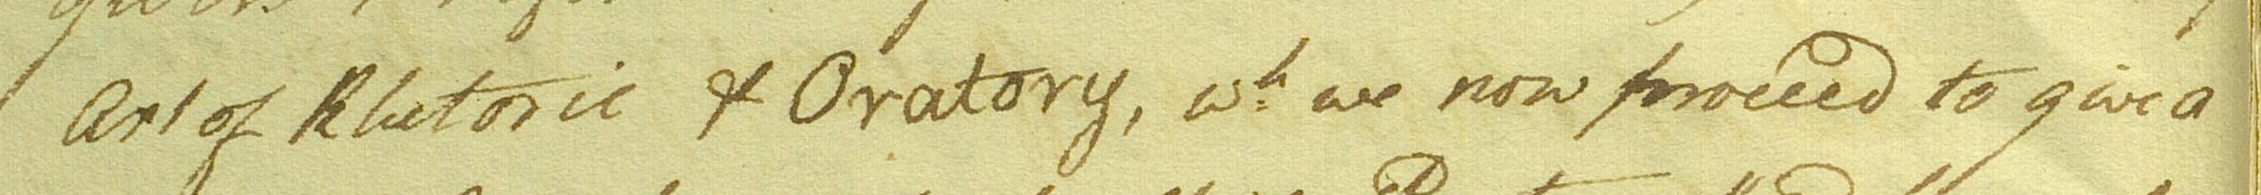Art of Rhetoric & Oratory, w^h. we now proceed to give a
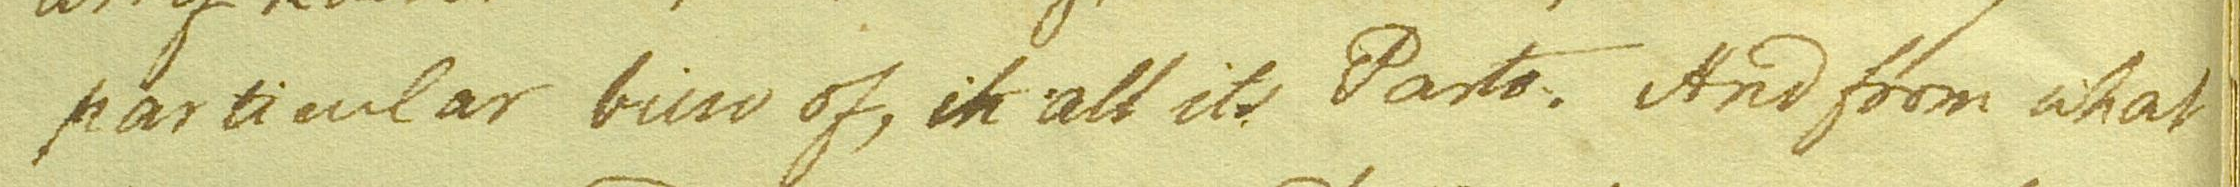particular view of, in all its Parts. And from what
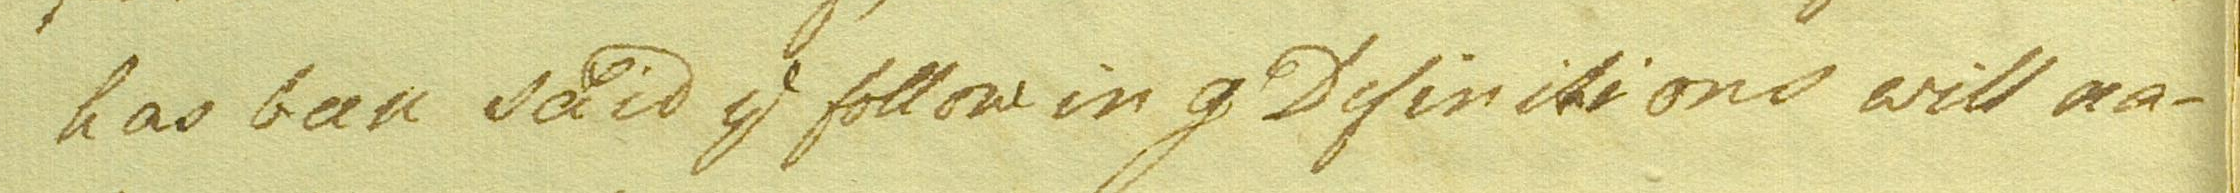has been said y^e following Definitions will na-
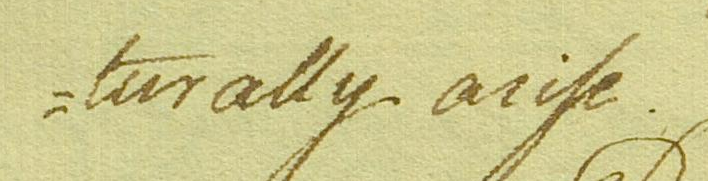-turally arise.
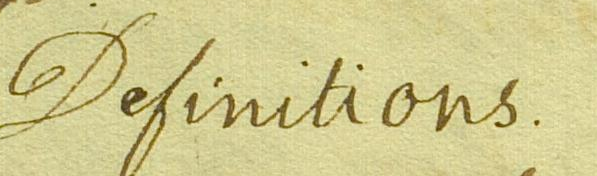Definitions.
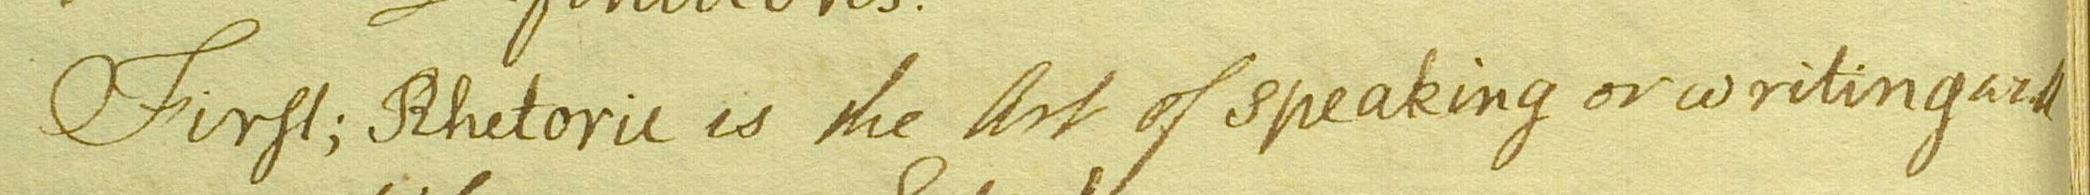First; Rhetoric is the Art of speaking or writing well
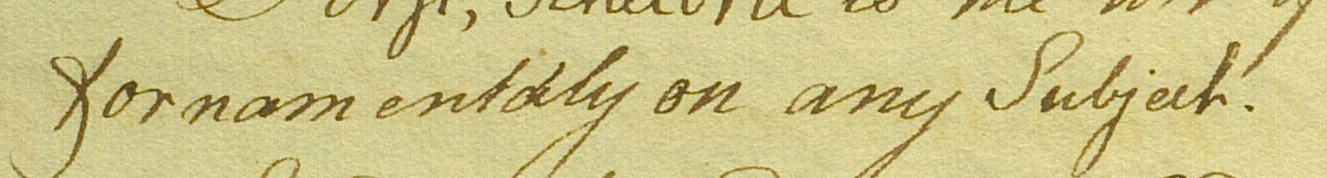& ornamentally on any Subject.
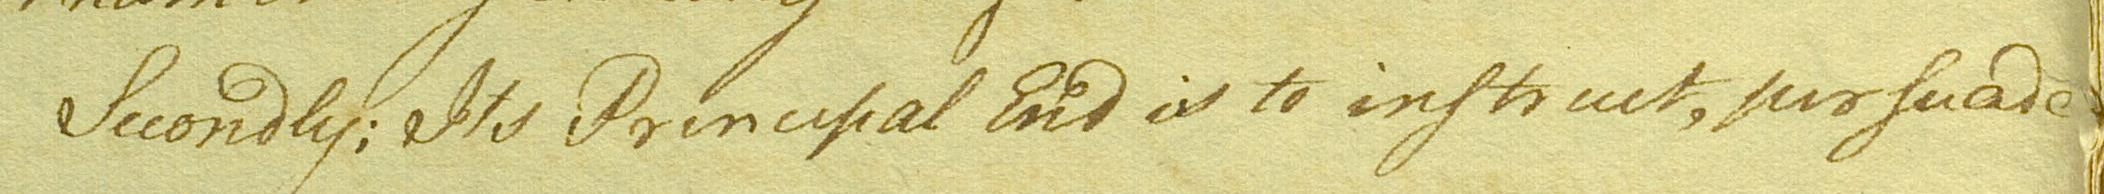Secondly; Its Principal End is to instruct, persuade,
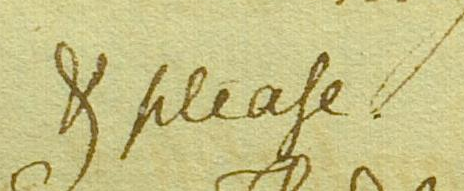& please.
